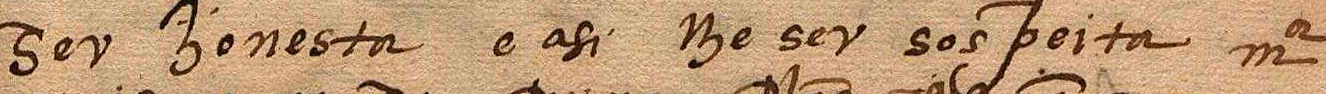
Ser honesta e asi lhe ser sospeita ma
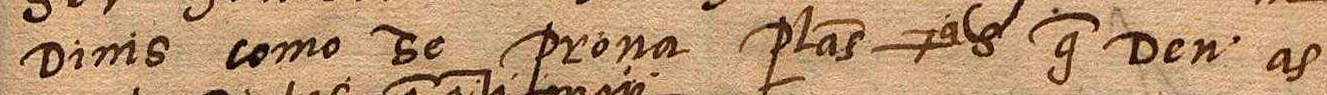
Dinis como de proua plās tas q̄ Deu as
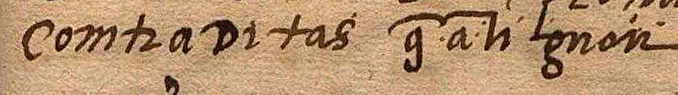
comtraditas q̄ alignou
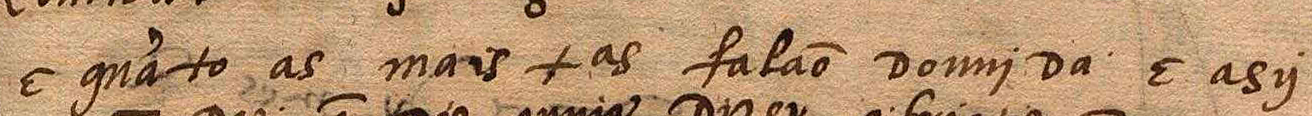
E quāto as mais tas falaõ douujda E asy
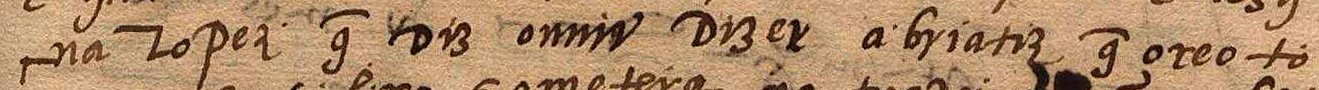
cna Lopez q̄ diz ouuir dizer a briatiz q̄ o reo to
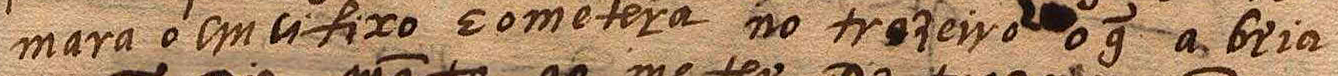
mara o crucifixo E o metera no trazeiro o q̄ a bria
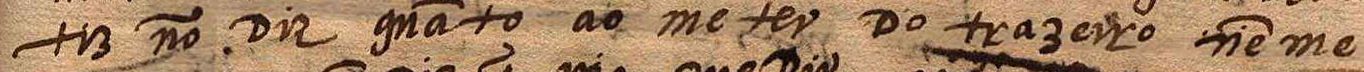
tiz n̄o diz quāto ao meter do trazeiro nē me
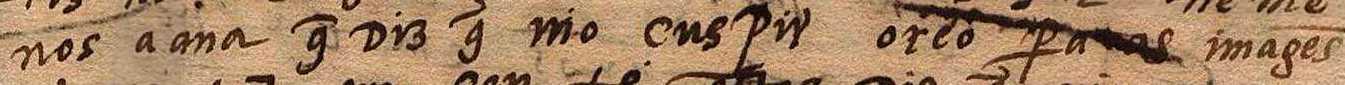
nos a ana q̄ diz q̄ uio cuspir o reo ꝑ as imagēs
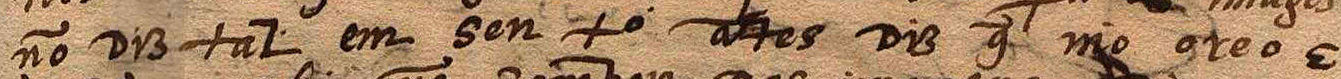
n̄o diz taL em seu to ātes diz q̄ uio o reo E
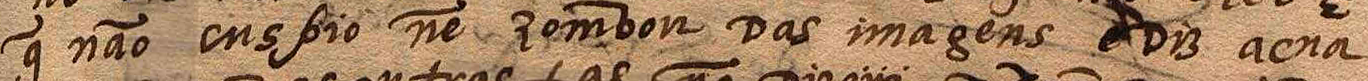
q̄ não cuspio n̄e zombou das imagens e diz a cna
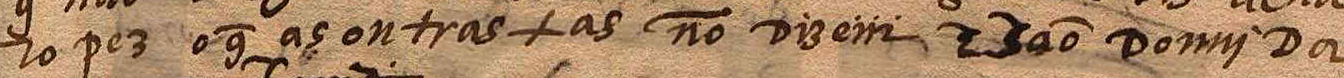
lopez o q̄ as outras tas n̄o dizem E saõ douujda
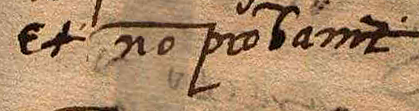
Et n̄o probamt
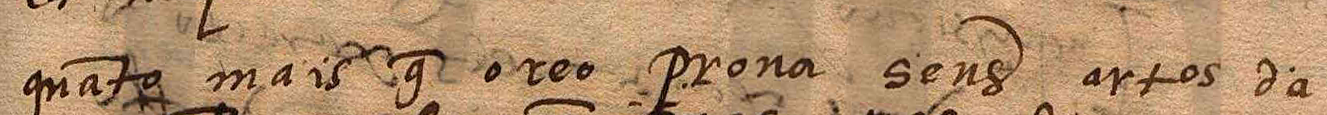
quāto mais q̄ o reo proua seus artos da
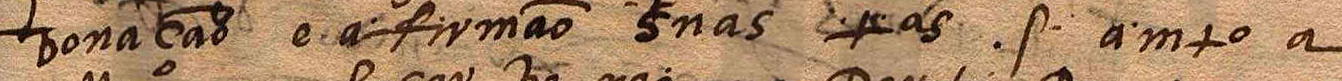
bonaçaõ e afirmão suas tas .s. amto a
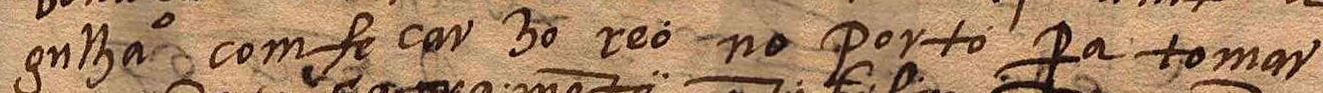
gulha comfeçar ho reo no porto ꝑa tomar
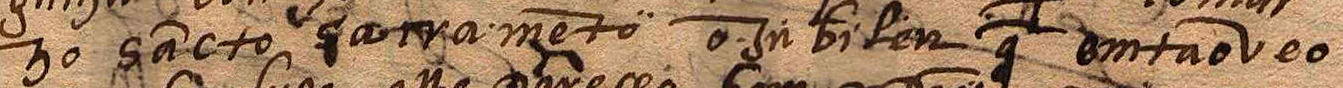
ho sācto sacramēto o Jubileu q̄ emtão veo
